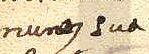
nunez sua
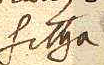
filha
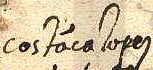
costāca lopez
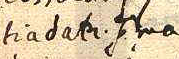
tia da R. p̄ma
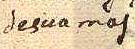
de sua maj
